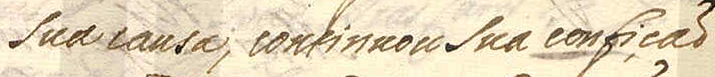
sua causa, continuou sua confiçaõ
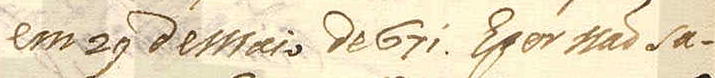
em 29 de maio de 67i. E per naõ sa
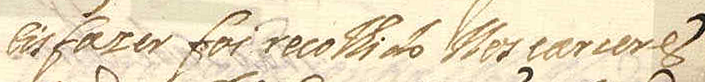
tisfazer foi recolhido Nos carceres
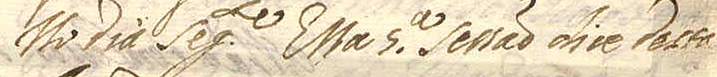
No dia seg.te E Na 5.a Sessaõ dice desta
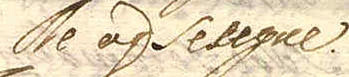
Re o q̄ se segue.
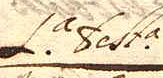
1.a test.a
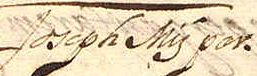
Joseph Miz̄ por.
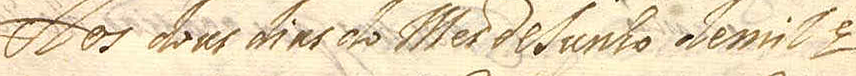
Aos dous dias do Mes de Iunho de mil E
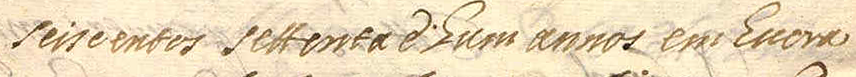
seiscentos settenta e hum annos em Euora
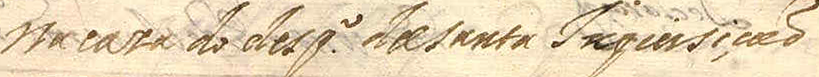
na casa do desp.o da santa Inquisiçaõ
